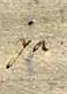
ya
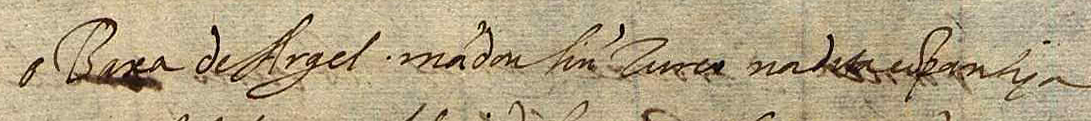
o Baxa de Argel. mādou hū Turco na dita cōpanhja
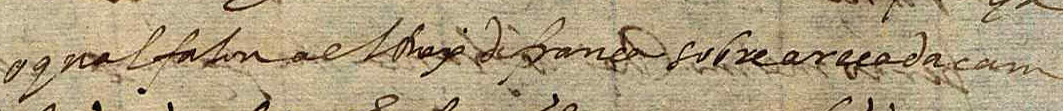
o qual falou a el Rey de frança sobre a recadacam
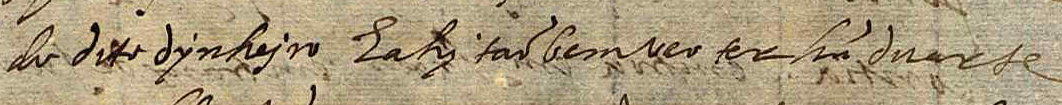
do dito dynhejro E ahj taõbem veo ter hū duarte
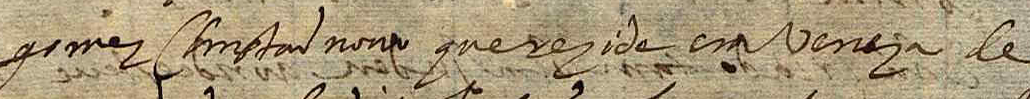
gomez Christaõ nouo que rezide em Veneza de
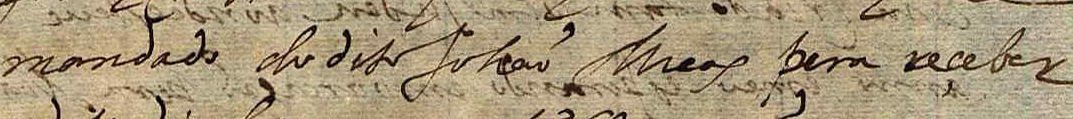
mandado do dito Johaõ Micas pera reçeber
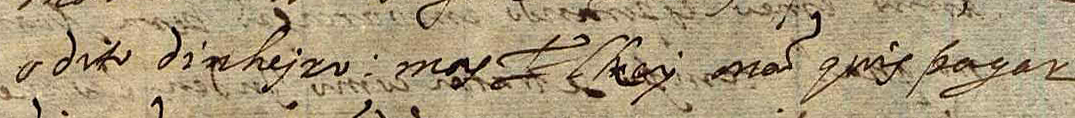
o dito dinhejro: mas El Rey o naõ quis pagar
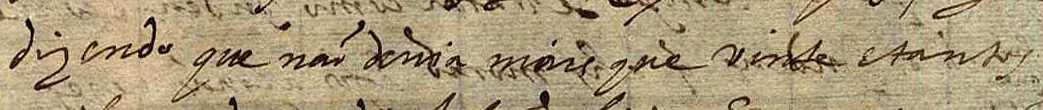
dizendo que naõ deuia mais que vinte E tantos
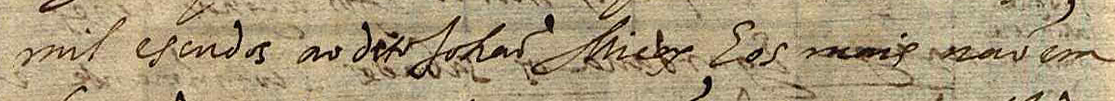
mil escudos ao dito Johaõ Micas E os mais naõ era
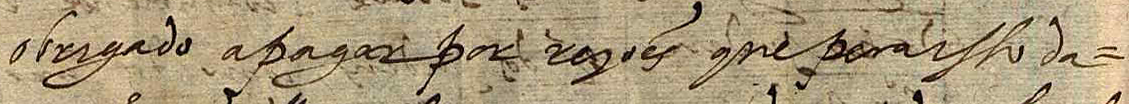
obrigado a pagar por rezoẽs que pera isso da
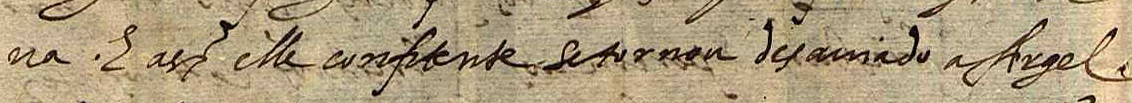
ua. E asj̄ elle confitente se tornou desauiado a Argel
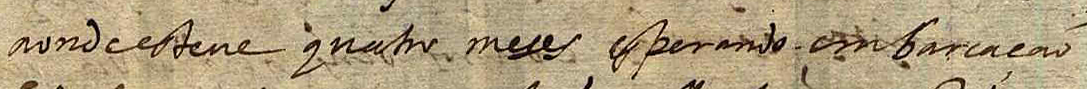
aonde esteue quatro meses esperando embarcaçaõ
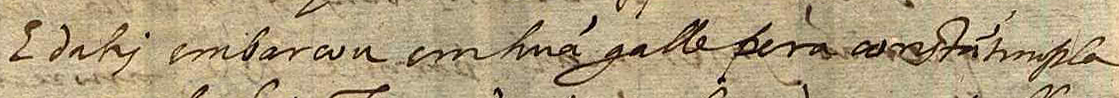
E dahj embarcou em huā galle pera constātinopla
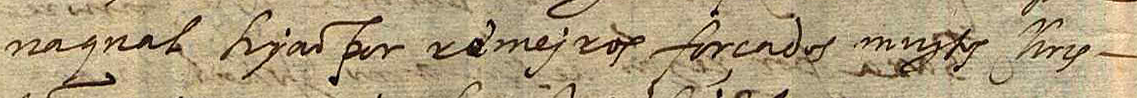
na qual hyaõ por remejros forçados mujtos Chris
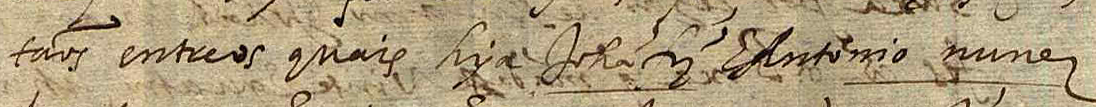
taõs entre os quais hya Johā Frz̄ E Antonio nunez
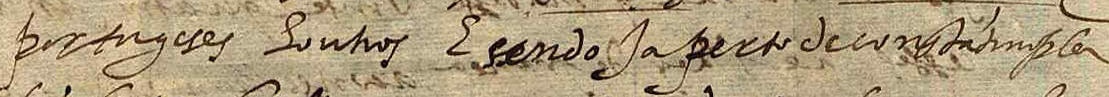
portugeses E outros E sendo Ja perto de constātinopla
